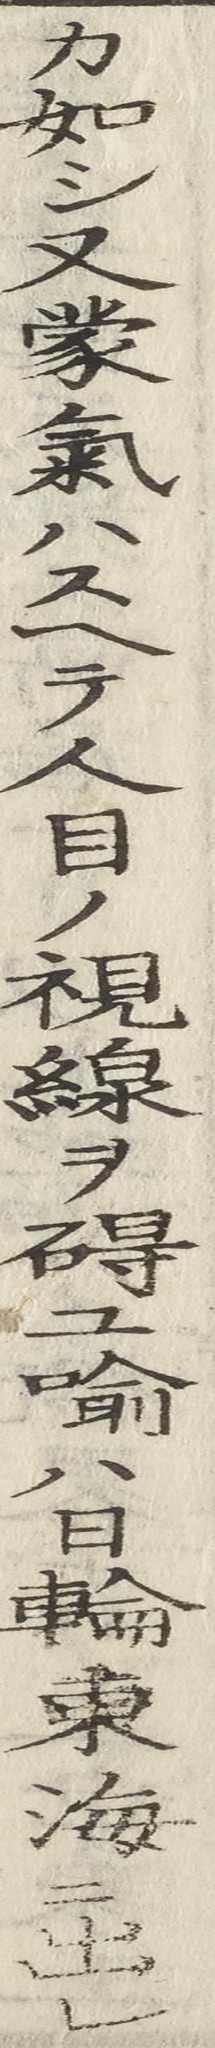カ如シ又蒙気ハスヘテ人目ノ視線ヲ碍ユ喩ハ日輪東海ニ出レ
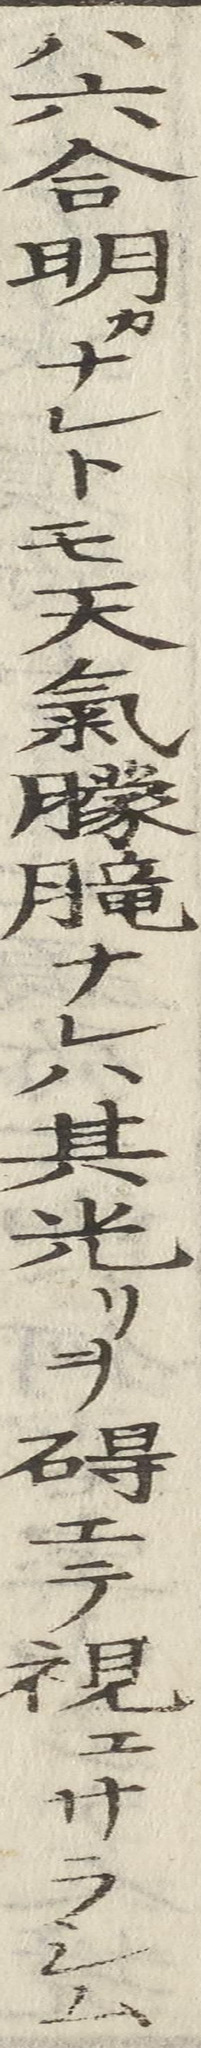ハ六合明天気朦朧ナレハ其光リヲ碍エテ視エサラシム
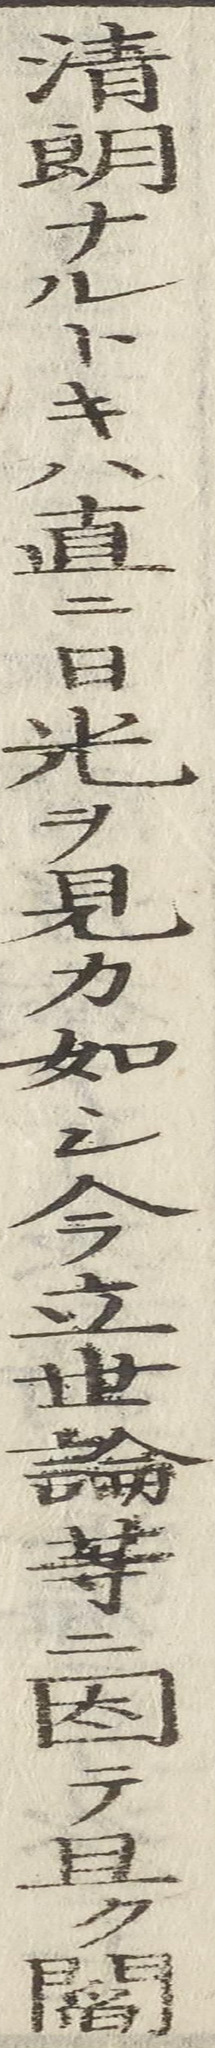清朗ナルトキハ直ニ日光ヲ見カ如シ今立世論等ニ因テ且ク閻
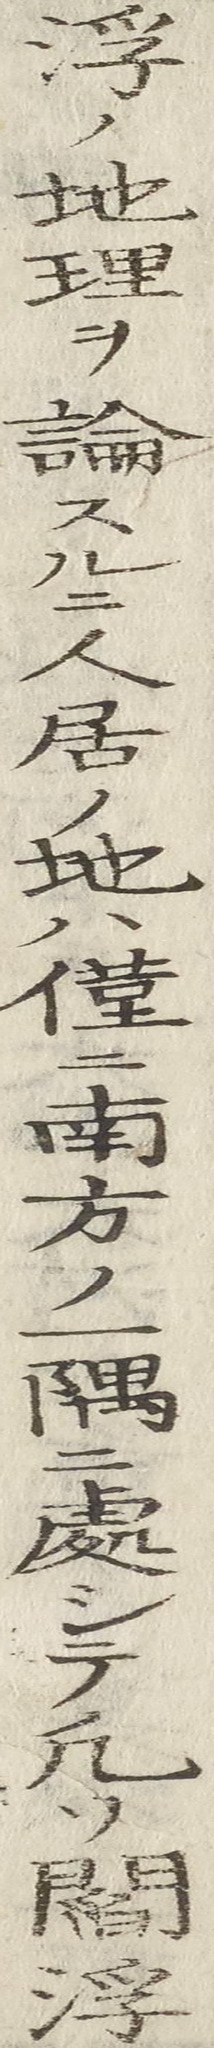浮ノ地理ヲ論スルニ人居ノ地ハ僅ニ南方ノ一隅ニ処シテ凡ソ閻浮
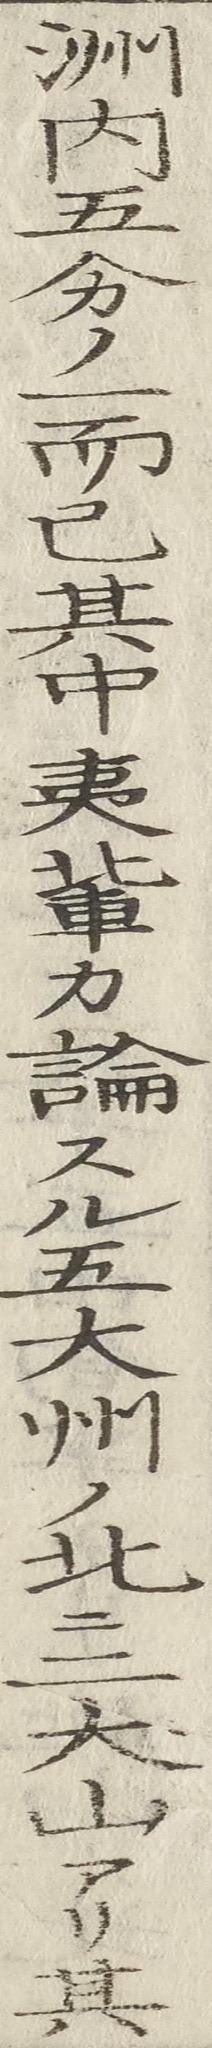洲内五分ノ一而已其中夷軰カ論スル五大州ノ北ニ二大山アリ其
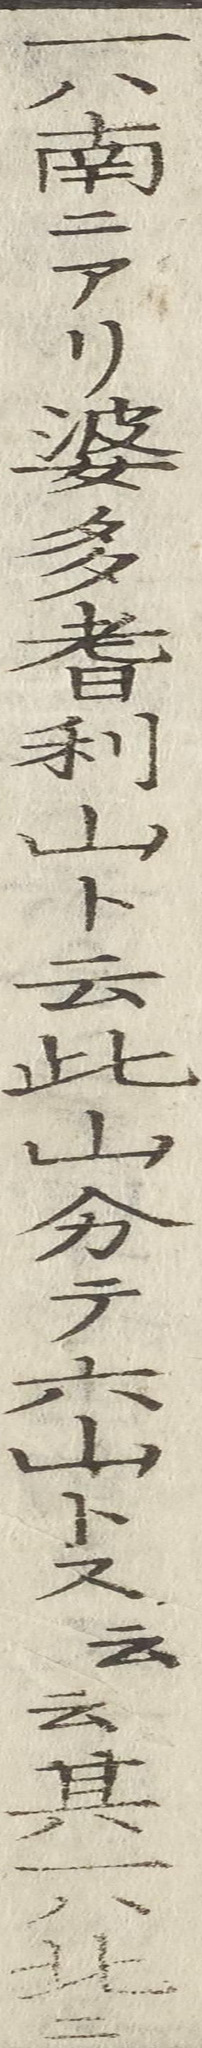一ハ南ニアリ婆多耆利山ト云此山分テ六山トス云云其一ハ北ニ

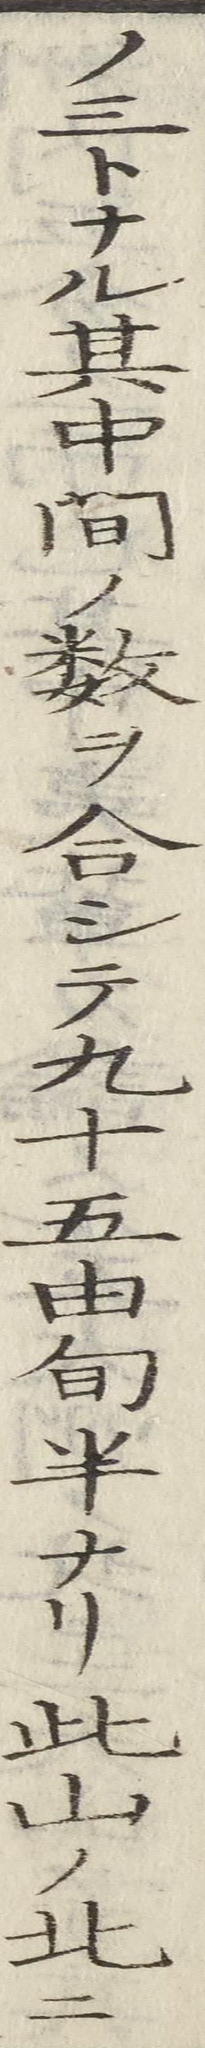ノ三トナル其中間ノ数ヲ合シテ九十五由旬半ナリ此山ノ北ニ
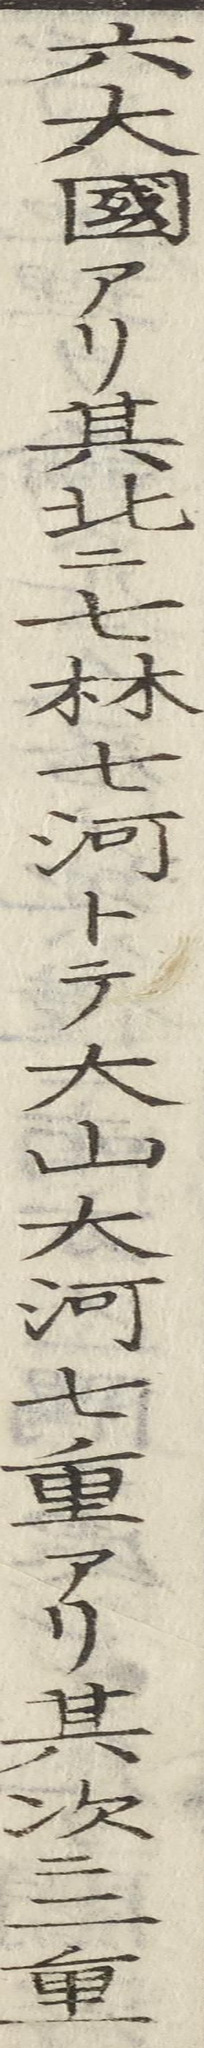六大国アリ其北ニ七林七河トテ大山大河七重アリ其次ニ二重
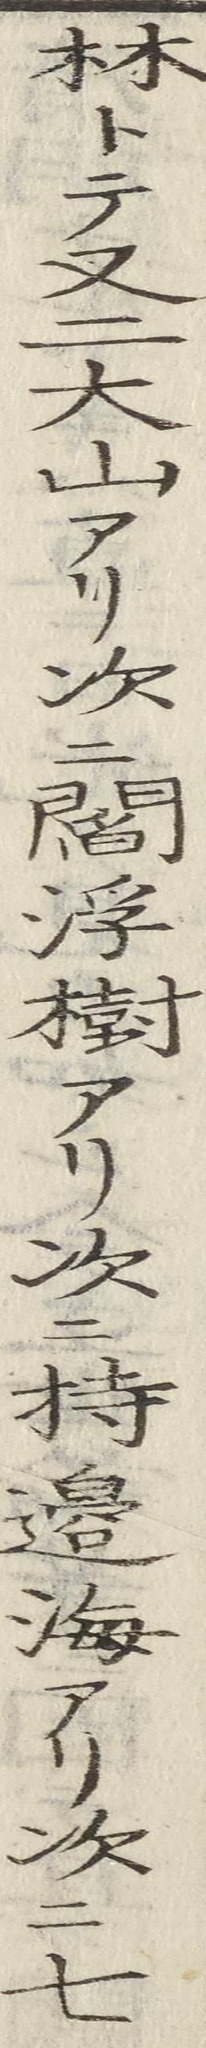林トテ又ニ大山アリ次ニ閻浮樹アリ次ニ持辺海アリ次ニ七
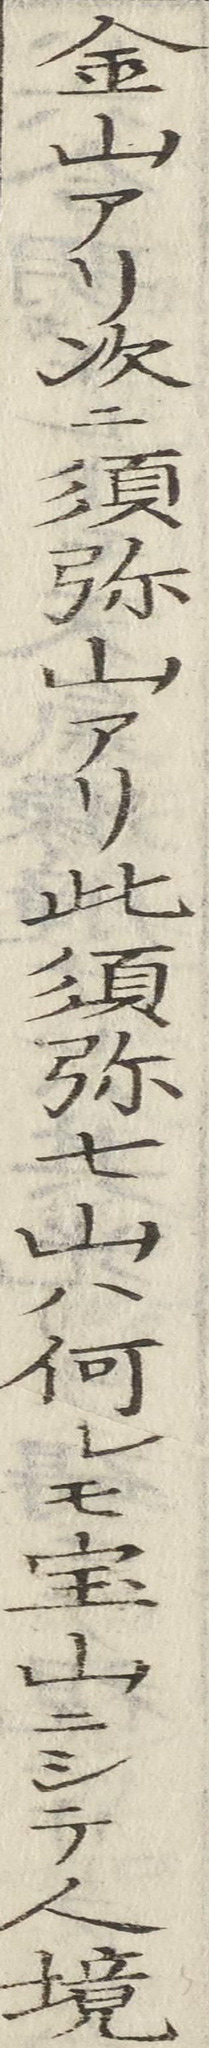金山アリ次ニ須弥山アリ此須弥七山ハ何レモ宝山ニシテ人境
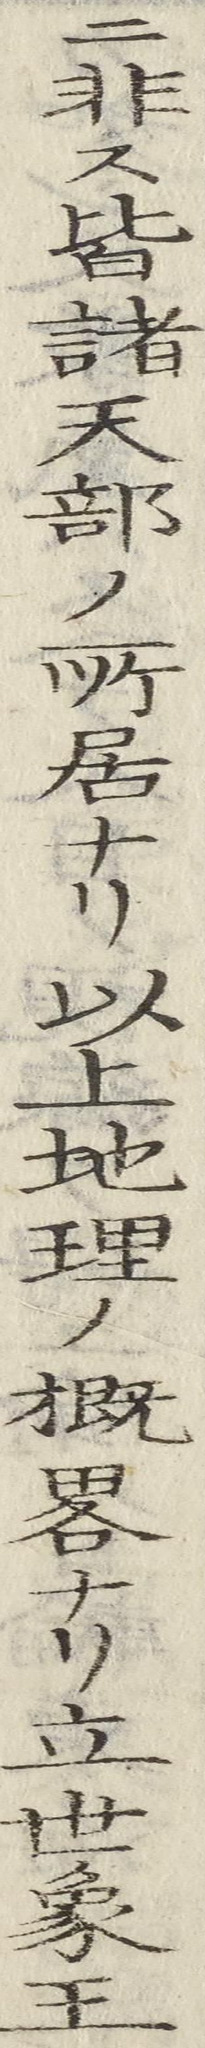ニ非ス皆諸天部ノ所居ナリ以上地理ノ概略ナリ立世象王
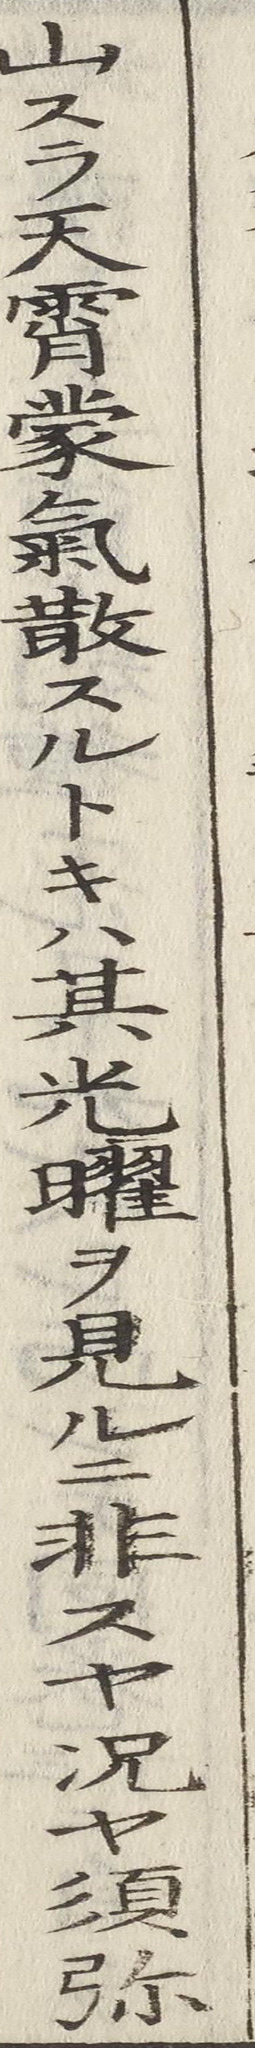山スラ天霄蒙気散スルトキハ其光曜ヲ見ルニ非スヤ況ヤ須弥
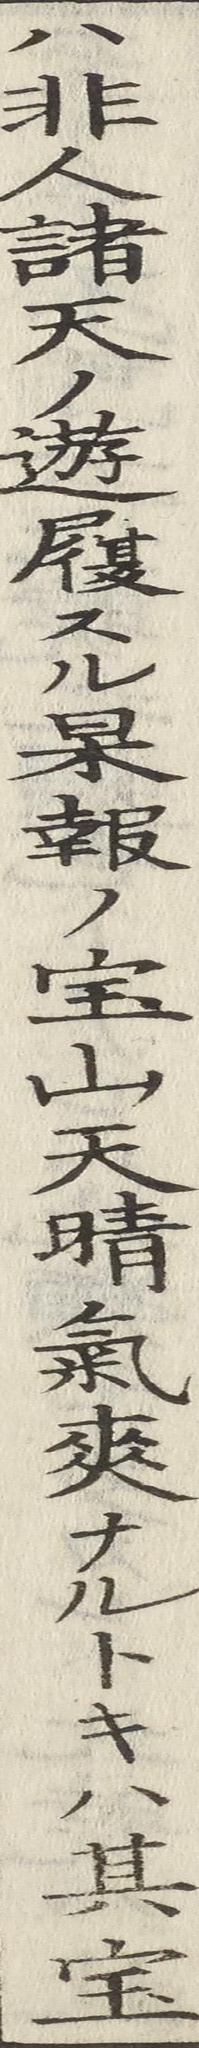ハ非人諸天ノ遊履スル果報ノ宝山天晴気爽ナルトキハ其宝
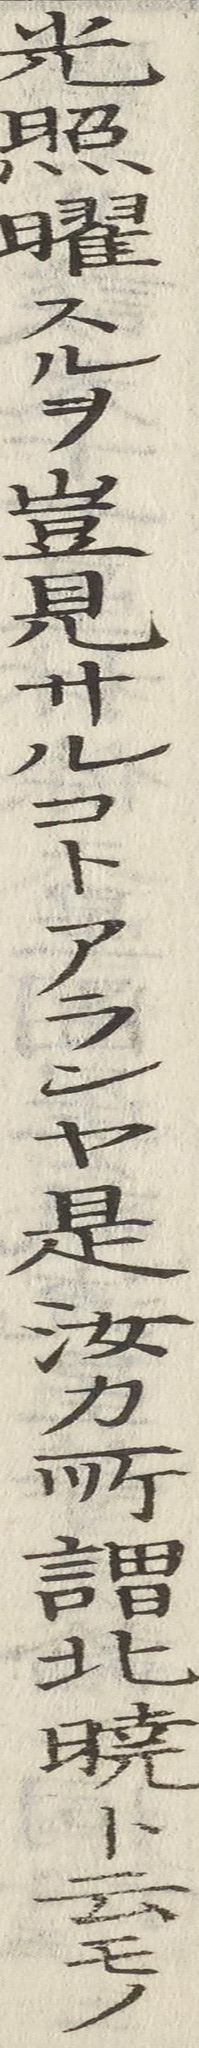光照曜スルヲ豈見サルコトアランヤ是汝カ所謂北暁ト云モノ
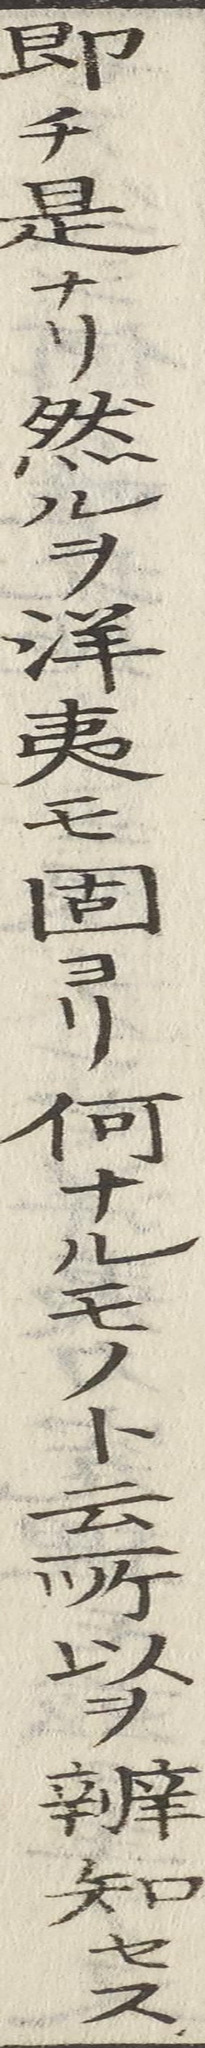即チ是ナリ然ルヲ洋夷モ固ヨリ何ナルモノト云所以ヲ弁知セス

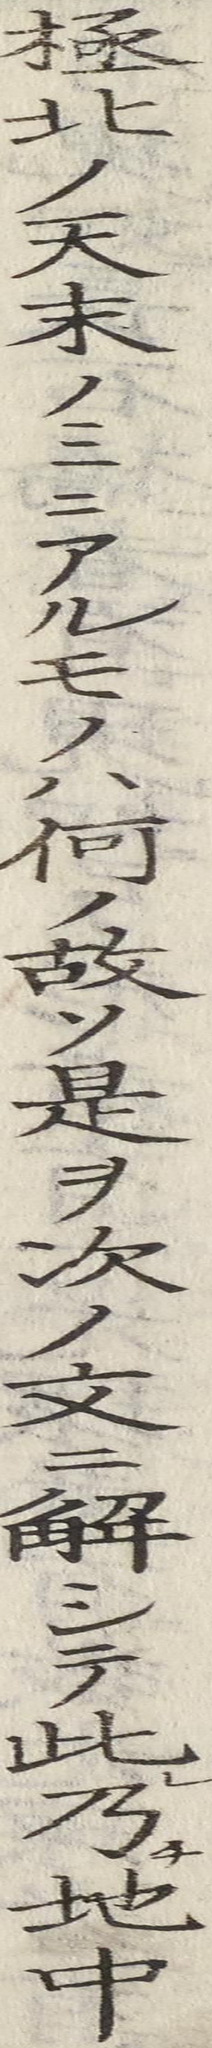極北ノ天未ノミニアルモノハ何ノ故ソ是ヲ次ノ文ニ解シテ此乃地中
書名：護法新論　二編　中
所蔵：東京大学地震研究所図書室 Earthquake Research Institute Library, The University of Tokyo, JAPAN
